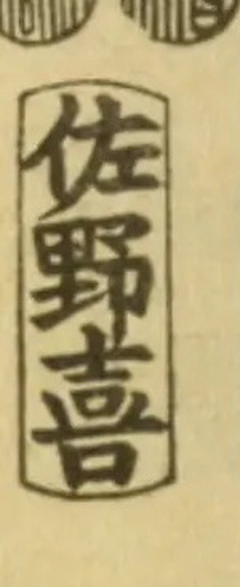佐野喜
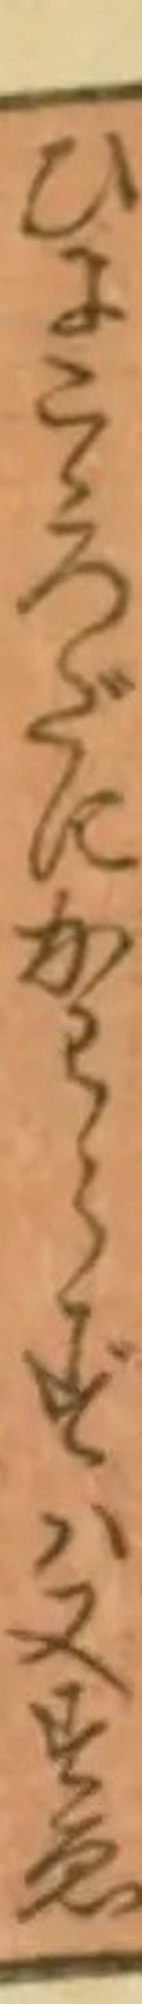ひにこゝろだにかわらずは又すゑ
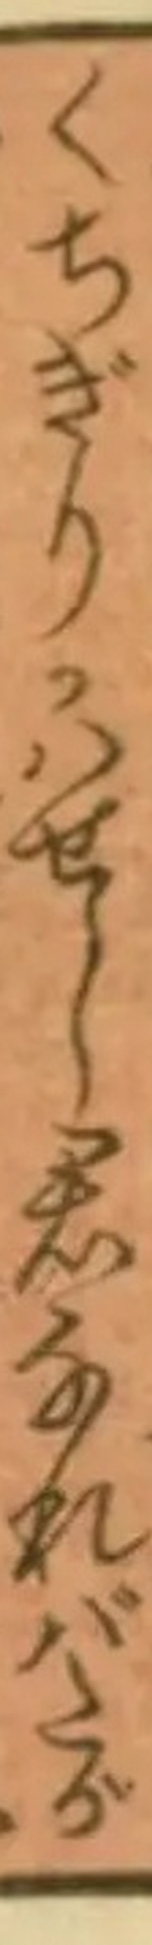くちぎりかはせし君なればたが
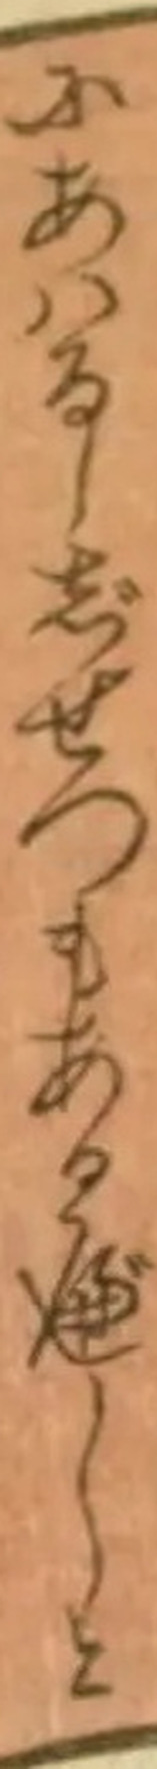にあはるゝじせつもあるべしと
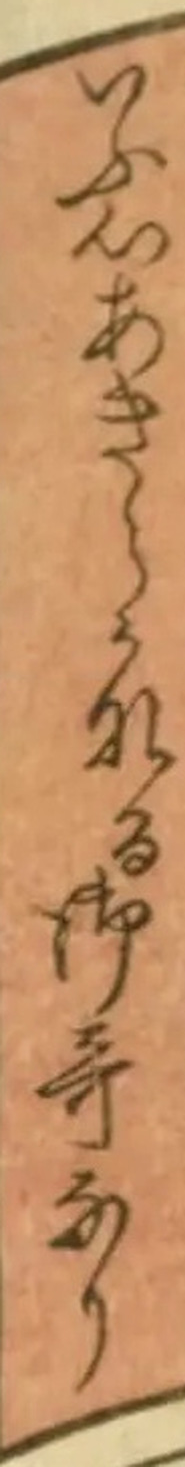いふ心あきらかなる御歌なり
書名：七十七番　崇徳院
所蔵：国立国会図書館 National Diet Library, JAPAN
